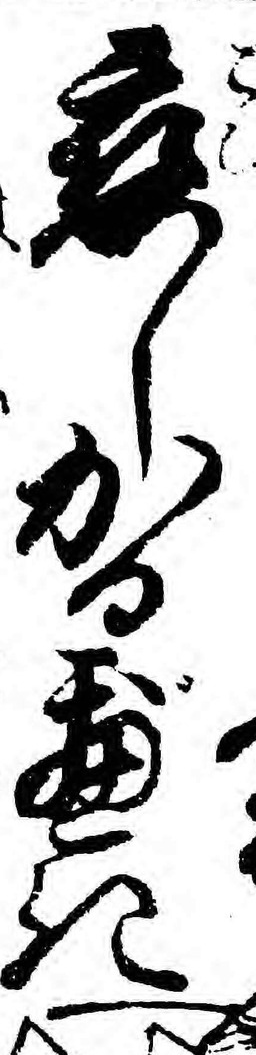恋しかるべき
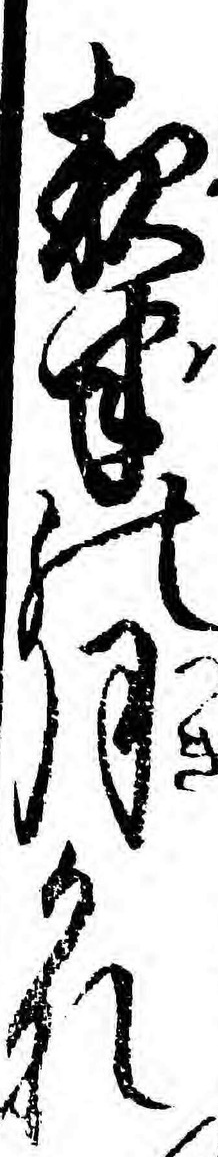夜半の月かな
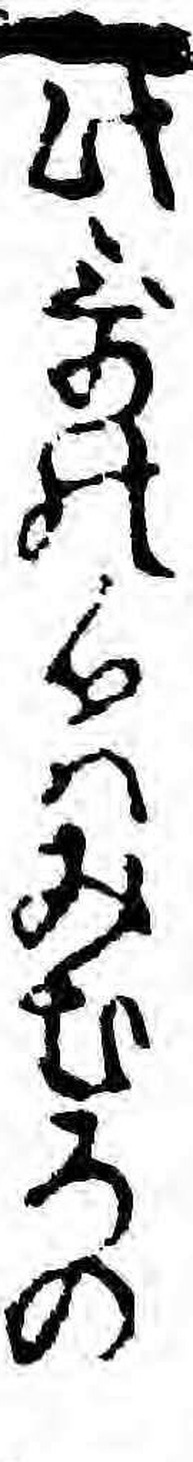此哥の心はみむろの
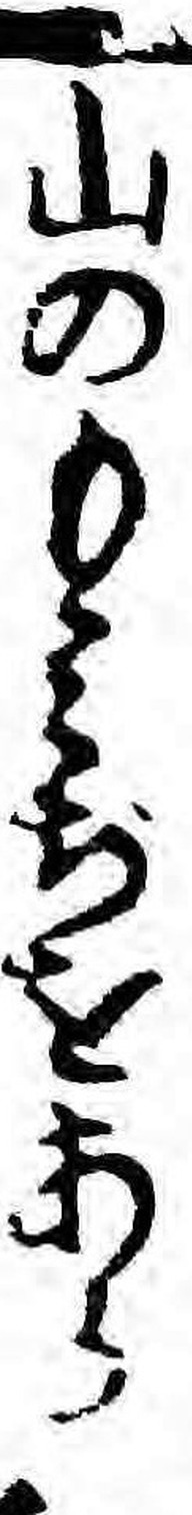山のもみぢをあら
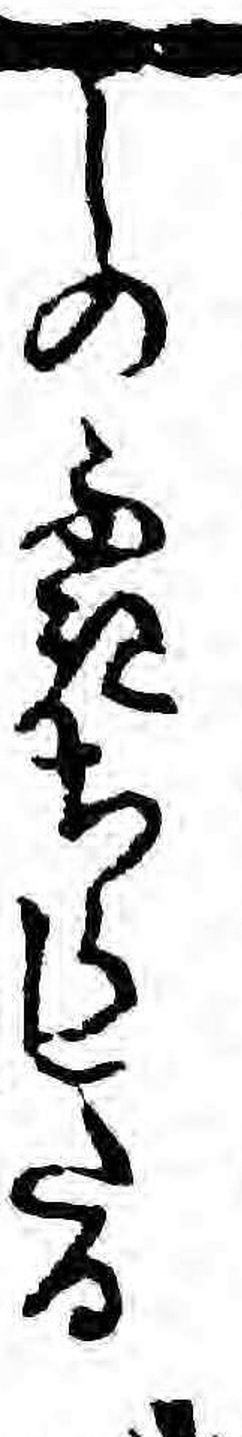しのふきちらしたる
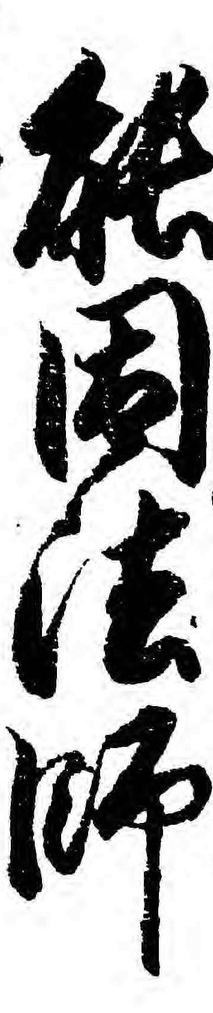能因法師
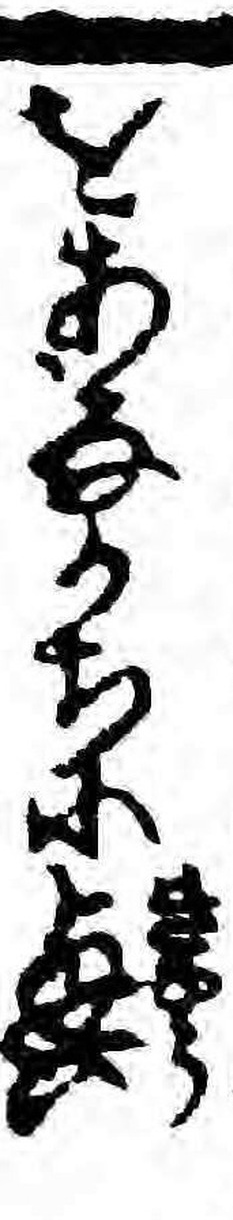をあなかちに興
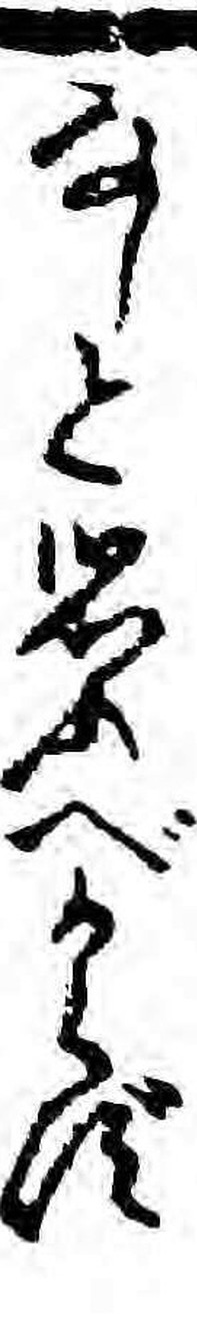なしと思ふべからず
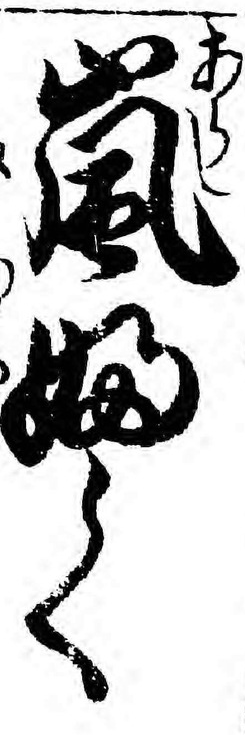嵐ふく
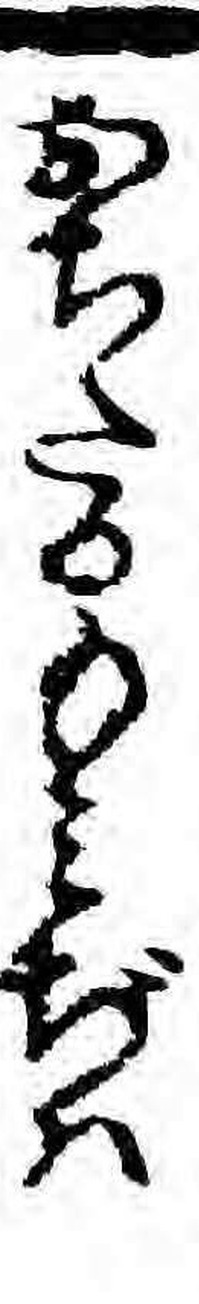おちたるもみぢは
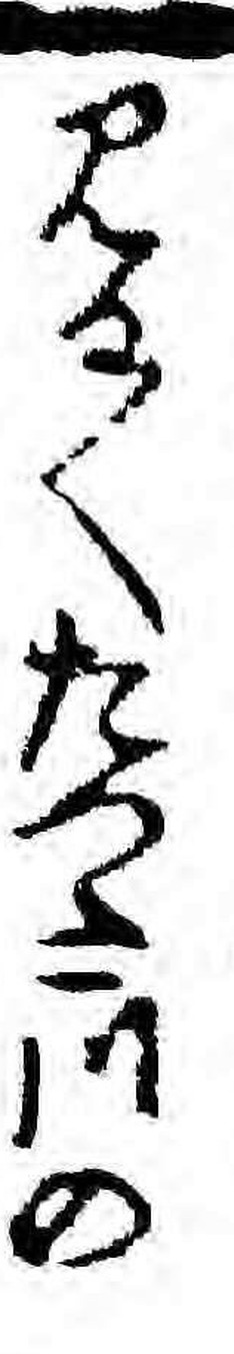見る〳〵たつた川の
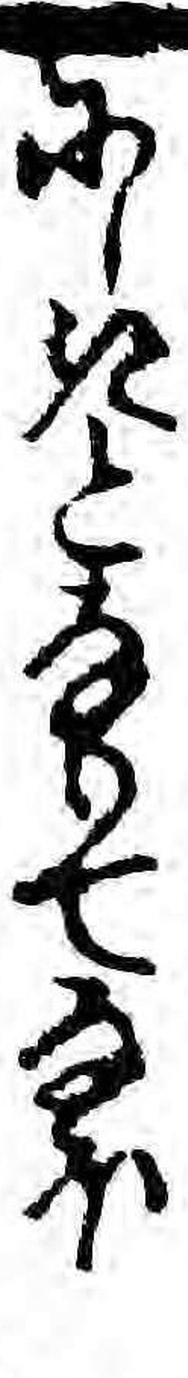にしきとなりてなほ
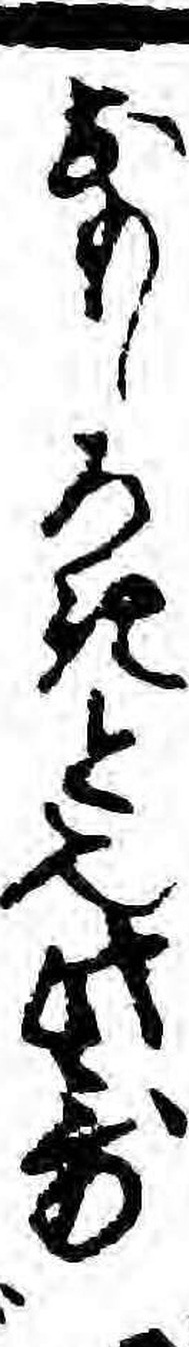おもしろきと也此哥
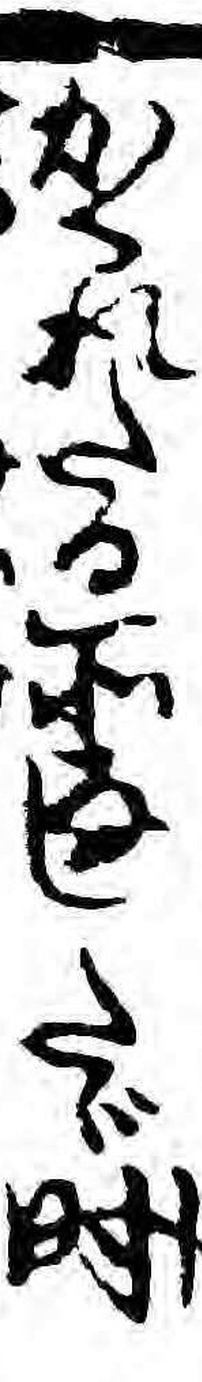かくれたる所なしたゞ時
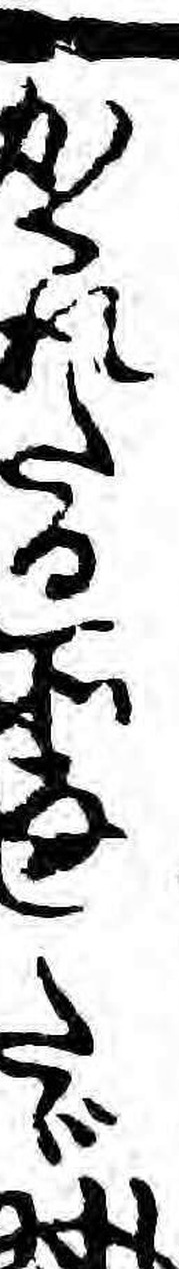かくれたる所なしたゞ時
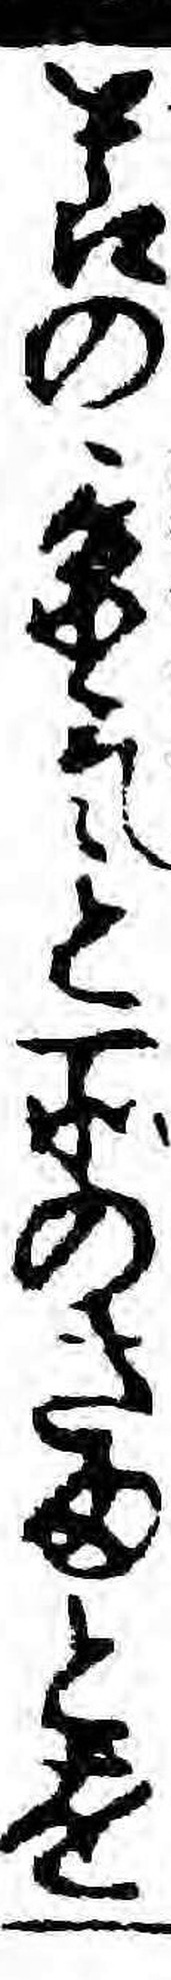節の景気と所のさまとを
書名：頭書和歌注譯／壽賀多百人一首小倉錦
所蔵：国文学研究資料館
